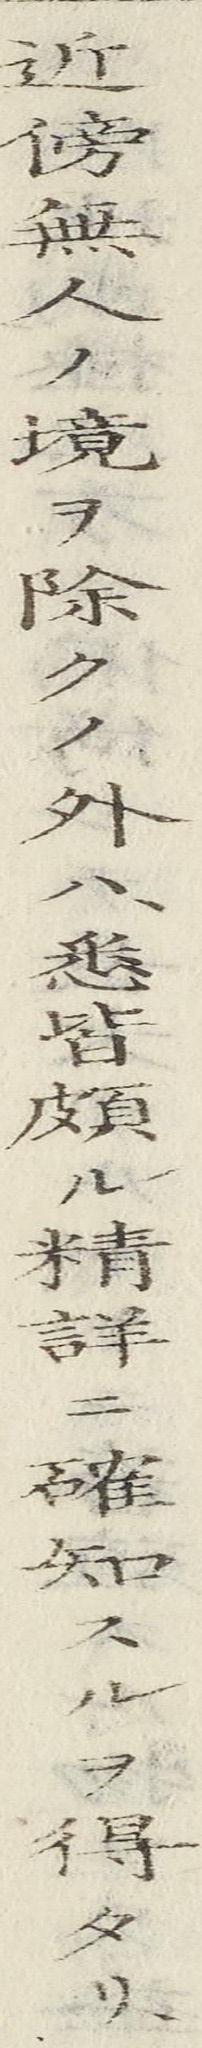近傍無人ノ境ヲ除クノ外ハ、悉皆頗ル精詳ニ確知スルヲ得タリ、
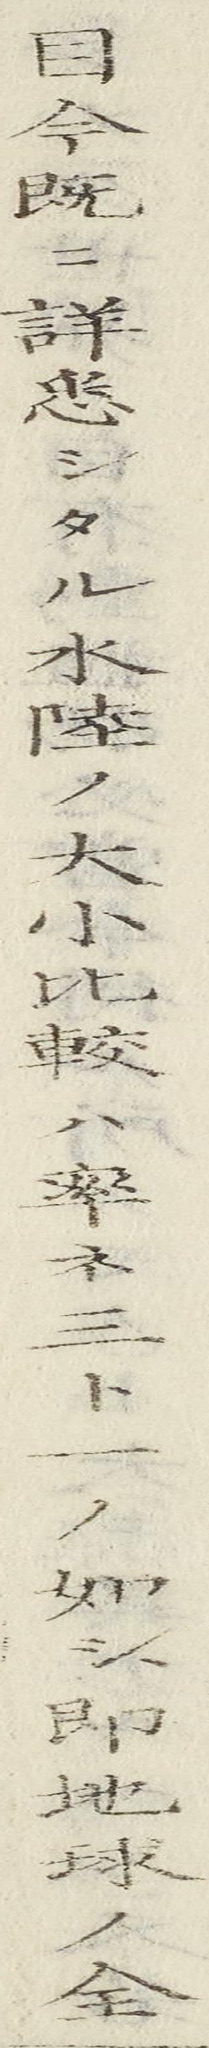目今既ニ詳悉シタル水陸ノ大小比較ハ率ネ三ト一ノ如シ、即地球ノ全
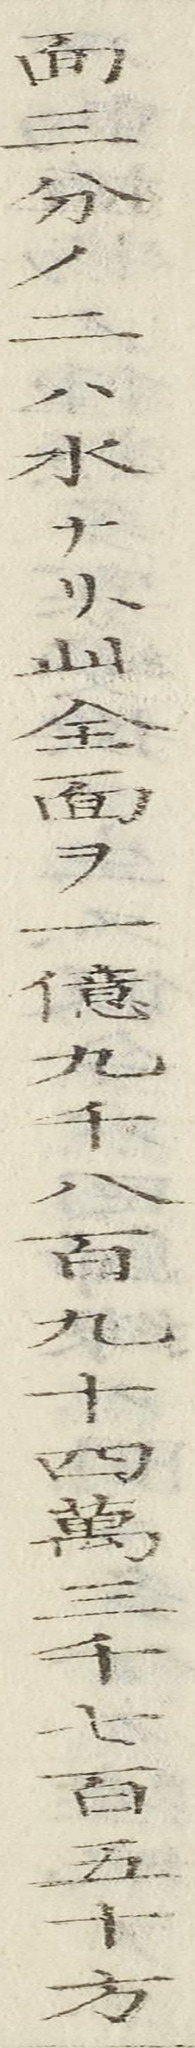面三分ノニハ水ナリ、此全面ヲ一億九千八百九十四万七百五十方
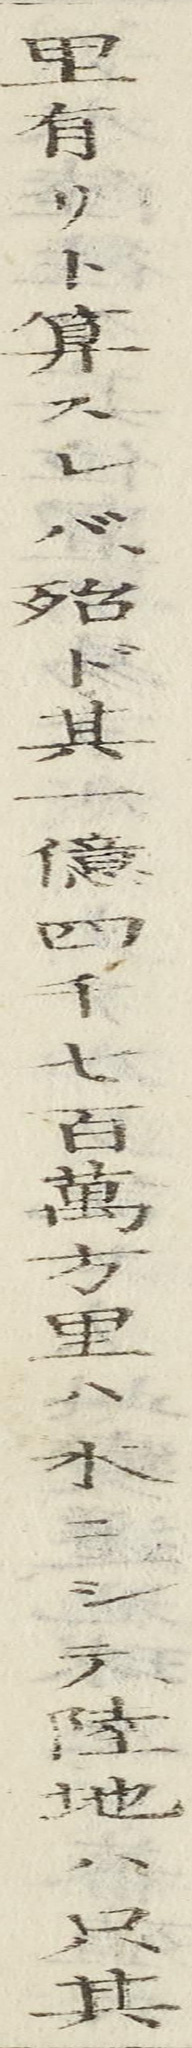里有リト算スレバ、殆ド其一億四千七百万方里ハ水ニシテ、陸地ハ只其
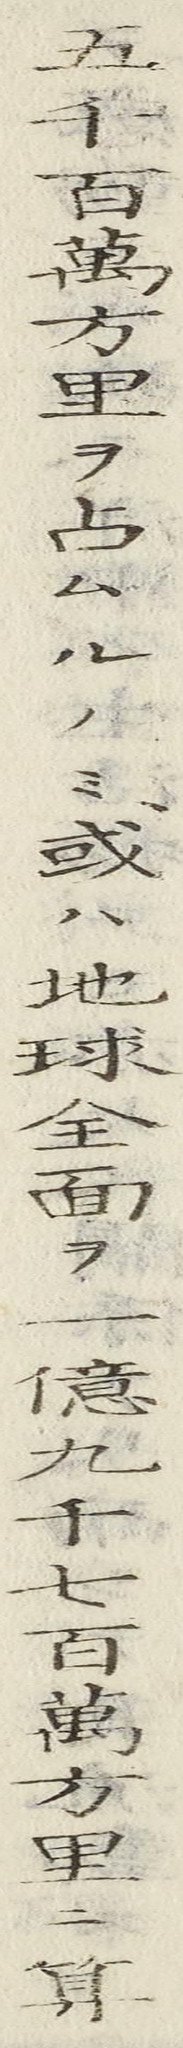五千百万方里ヲ占ムルノミ、或ハ地球全面ヲ一億九千七百万方里ニ算
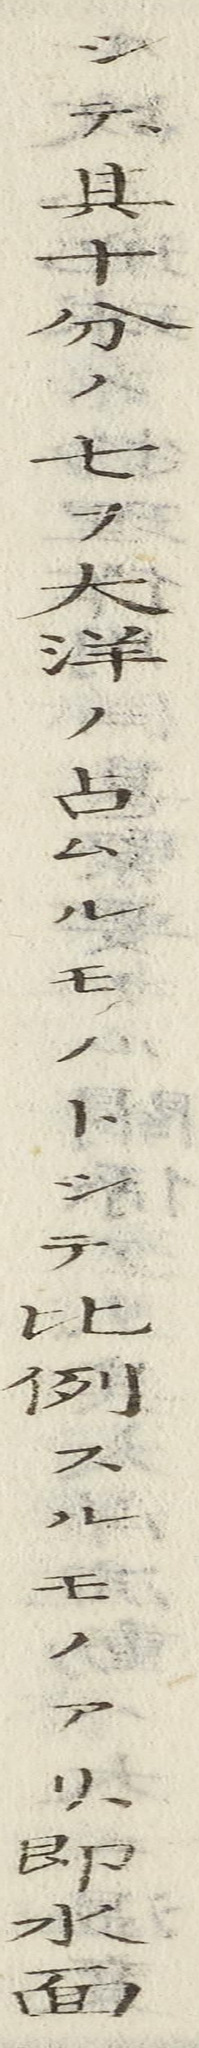シテ、其十分ノ七ヲ大洋ノ占ムルモノトシテ比例スルモノアリ、即水面
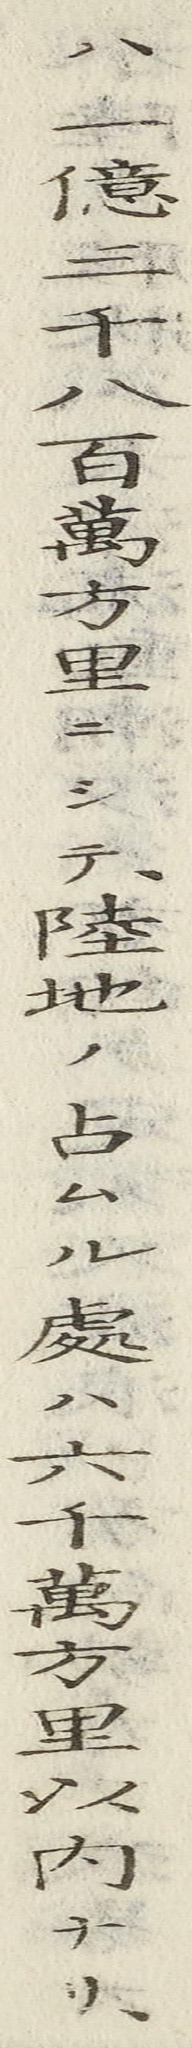ハ一億三千八百万方里ニシテ、陸地ノ占ムル処ハ六千万方里以内ナリ、
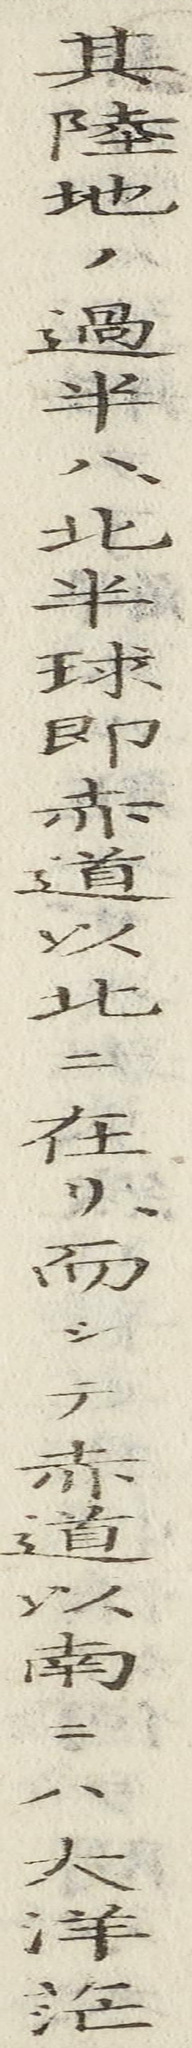其陸地ノ過半ハ、北半球即赤道以北ニ在リ、而シテ赤道以南ニハ大洋茫
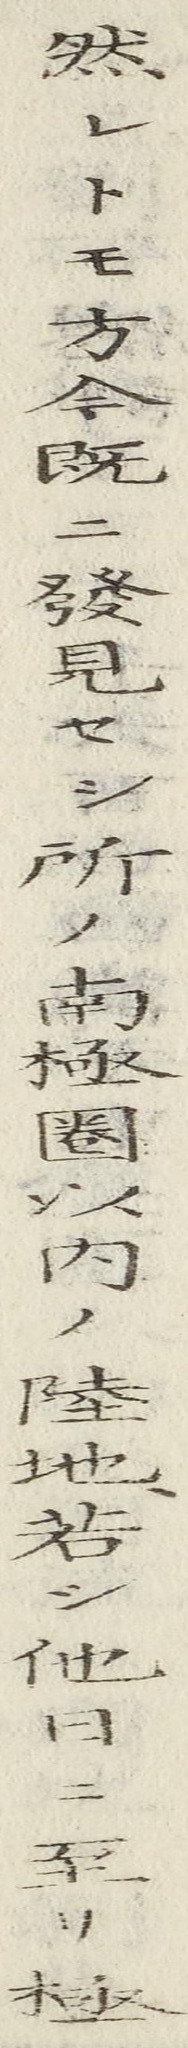然レトモ方今既ニ発見セシ所ノ南極圏以内ノ陸地、若シ他日ニ至リ極
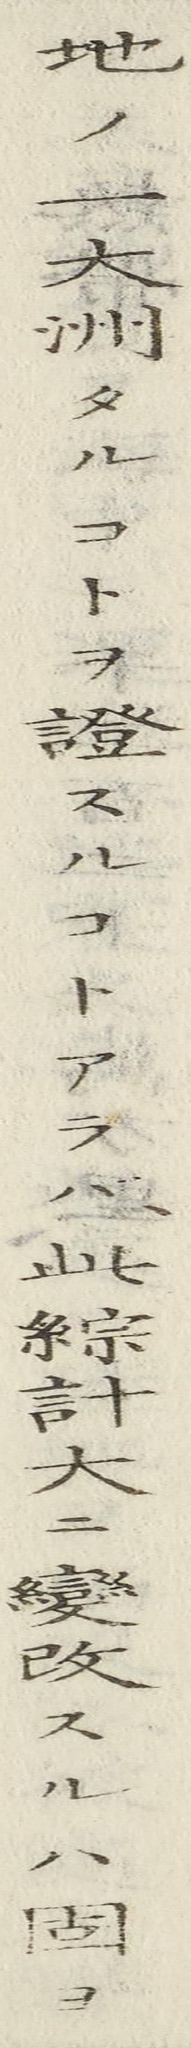地ノ一大洲タルコトヲ証スルコトアラバ、此綜計大ニ変改スルハ固ヨ
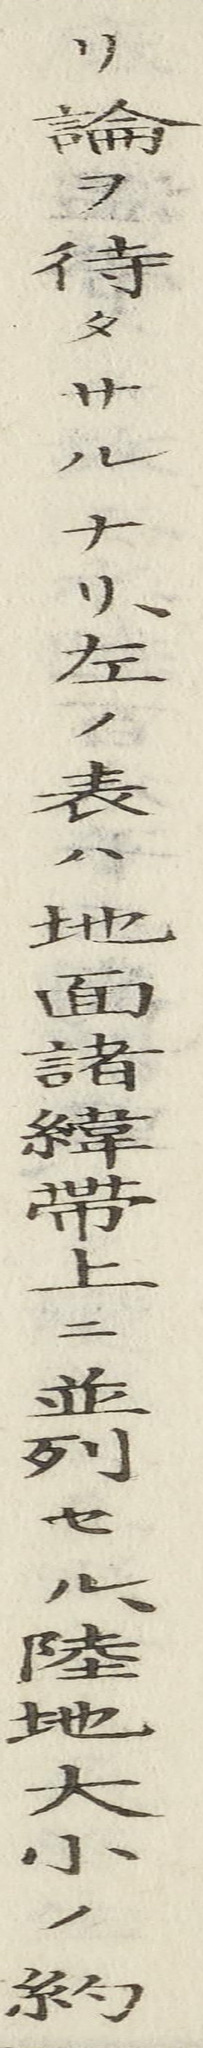リ論ヲ待タサルナリ、左ノ表ハ地面諸緯帯上ニ並列セル、陸地大小ノ約
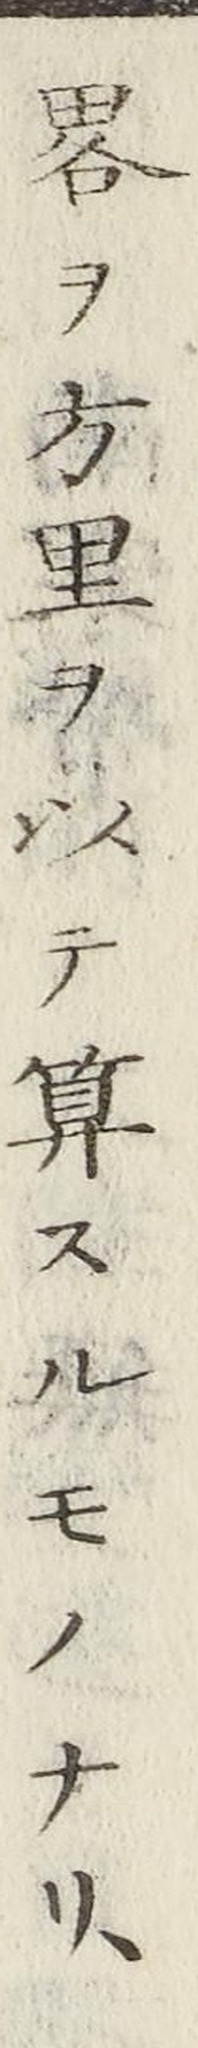略ヲ方里ヲ以テ算スルモノナリ、
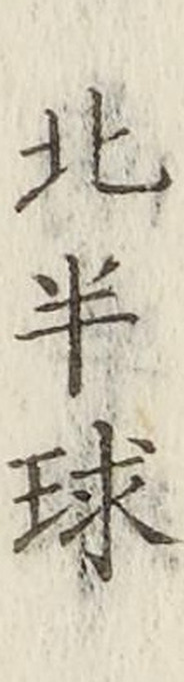北半球
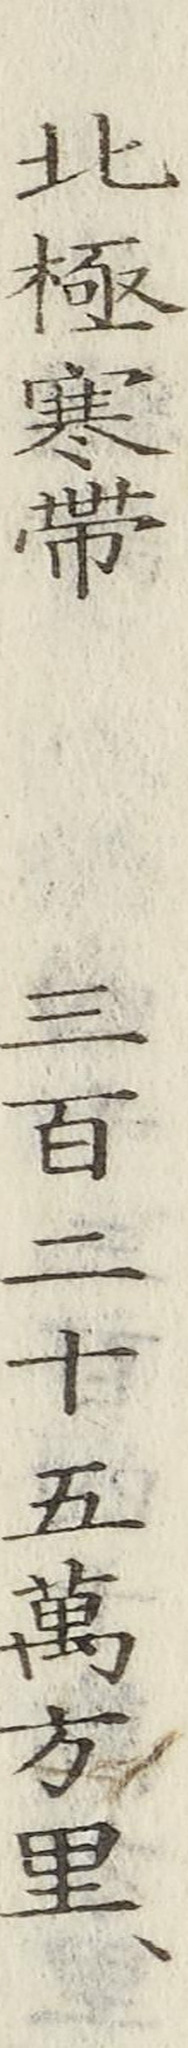北極寒帯三百二十五万方里、
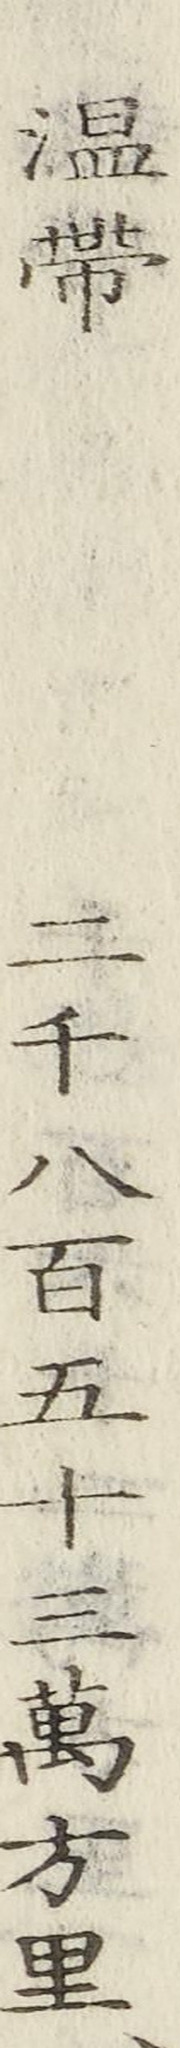温帯二千八百五十三万方里、

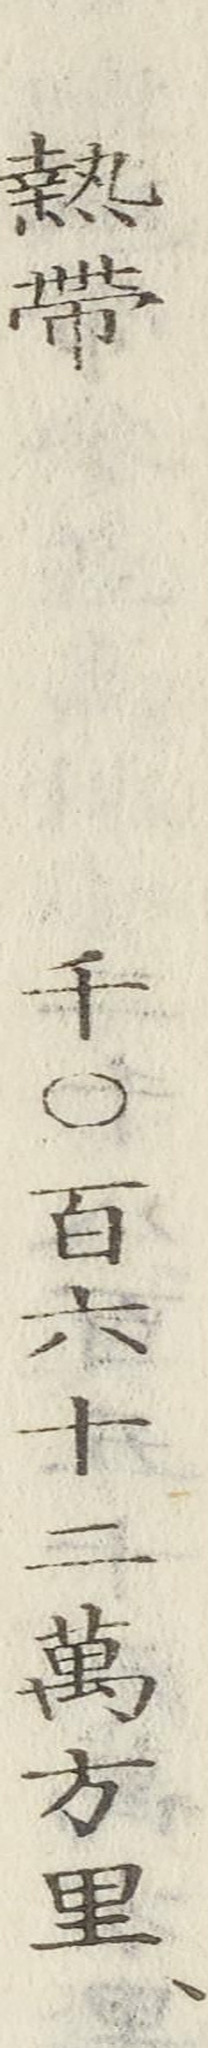熱帯千〇百六十二万方里、
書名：百科全書　地文學　全
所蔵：東京大学地震研究所図書室 Earthquake Research Institute Library, The University of Tokyo, JAPAN
